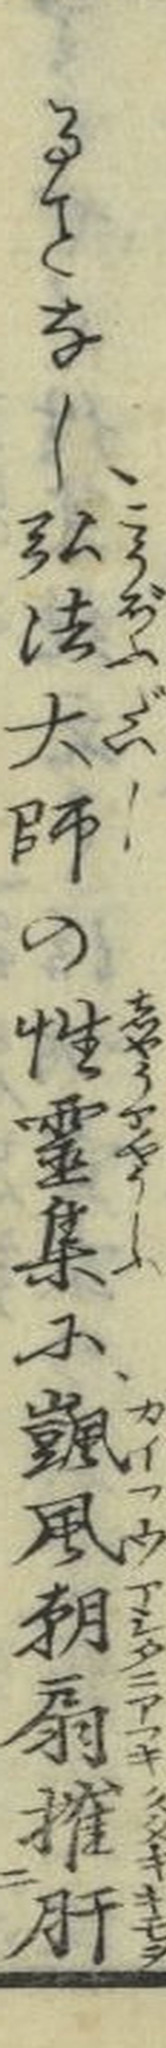ることなし、弘法大師の性霊集に凱風朝扇摧肝
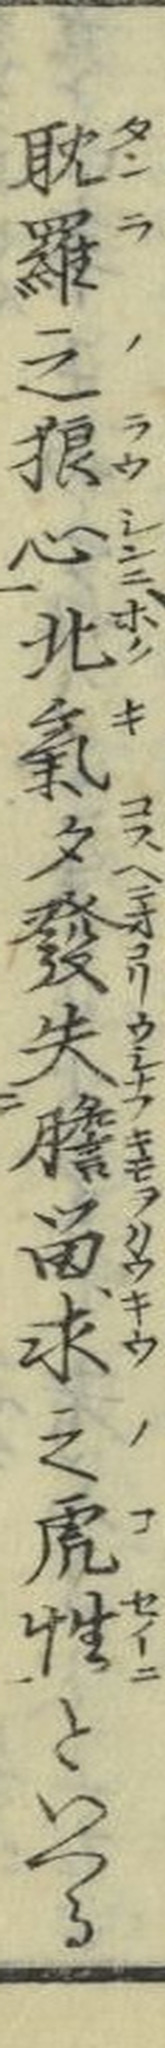耽羅之狼心、北気夕発失膽留求之虎性といへる
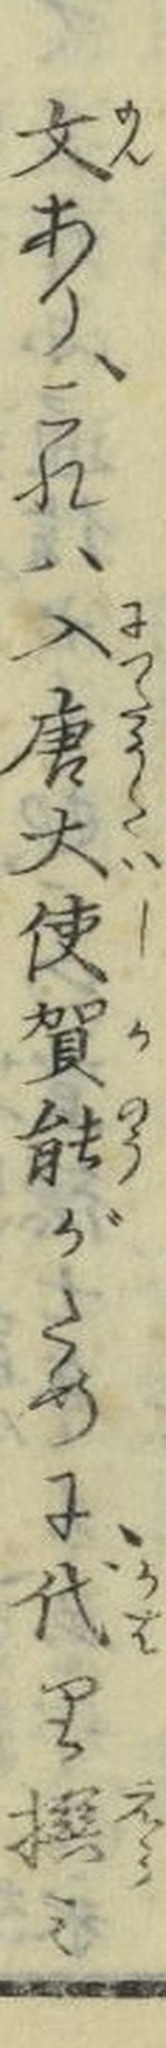文あり、これは入唐大使賀能がために、代り撰み
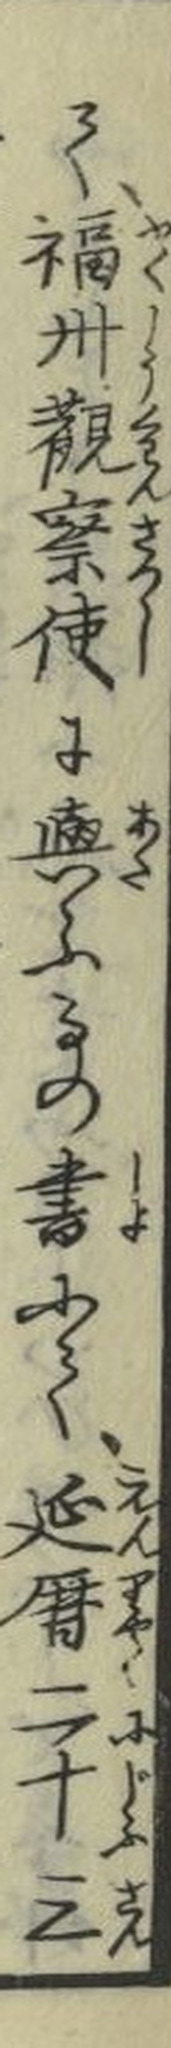て、福州観察使に与ふるの書にて、延暦二十三
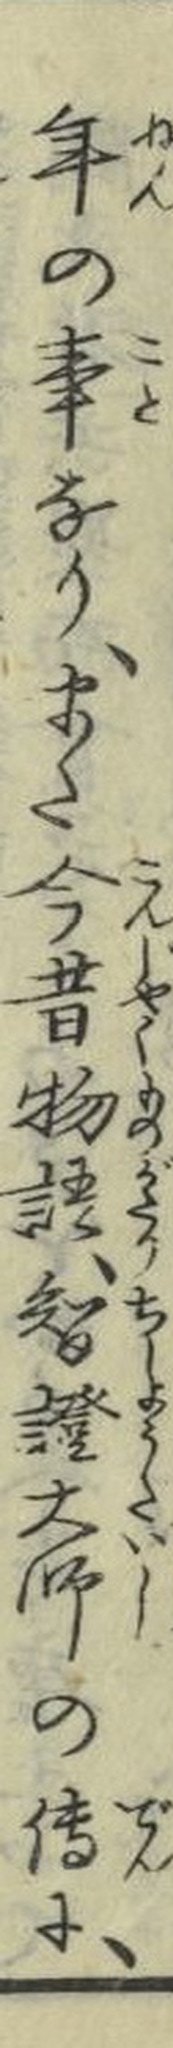年の事なり、また今昔物語、智証大師の伝に、
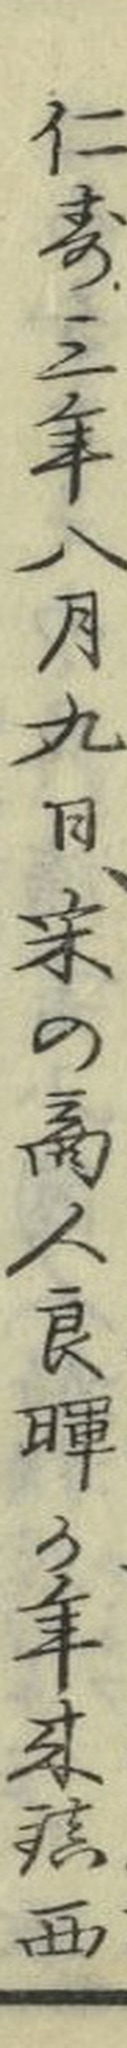仁寿三年八月九日、宋の商人良暉か、年来鎮西
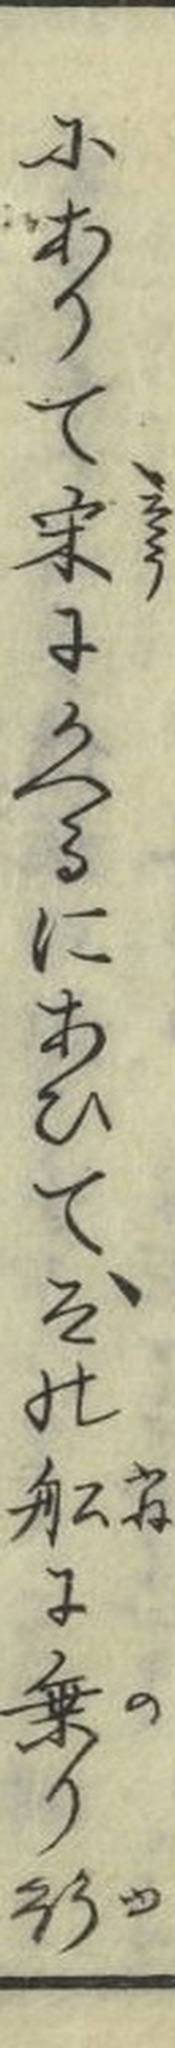にありて、宋にかへるにあひて、その船に乗り行
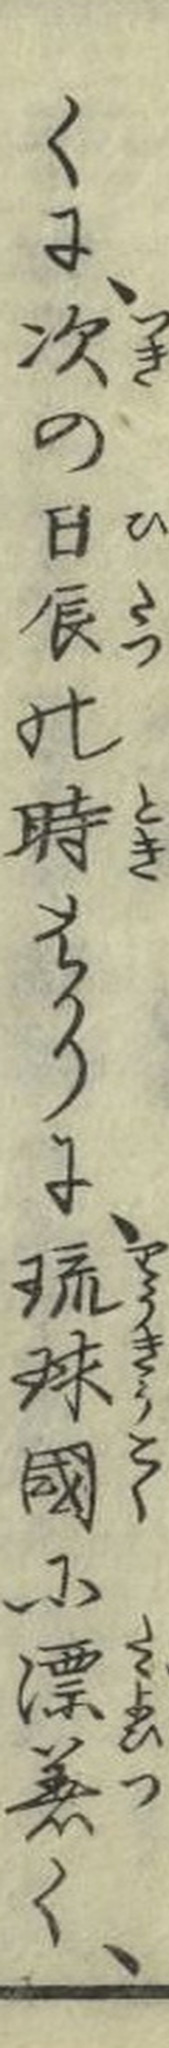くに、次の日辰の時はかりに、琉球国に漂着く、
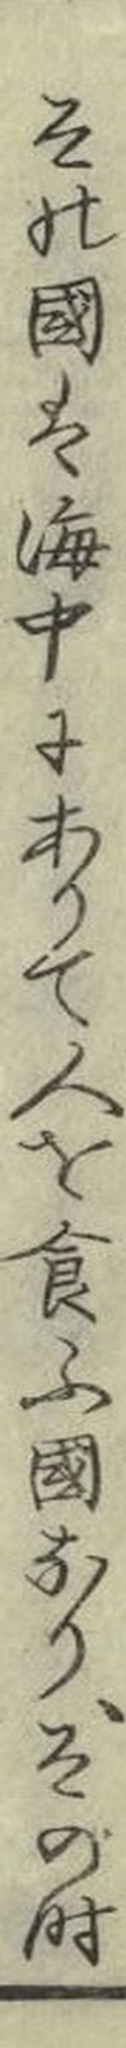その国は海中にありて人を食ふ国なり、その時
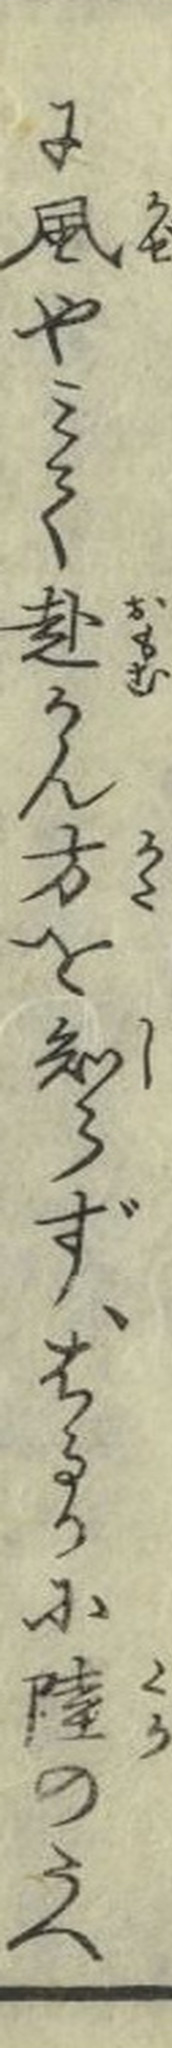に風やみて赴かん方を知らず、はるかに陸のうへ
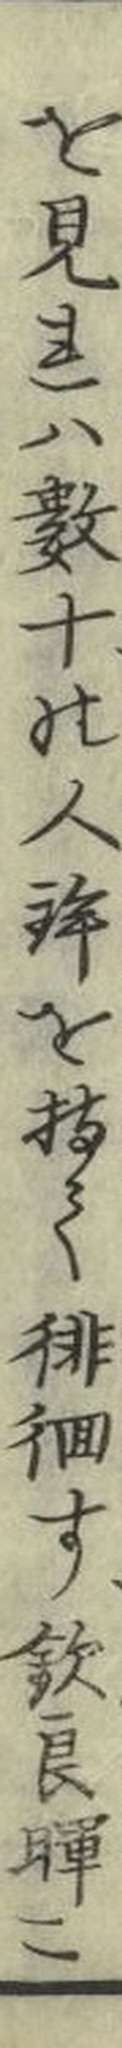を見れば数十の人鉾を持て徘徊す、欽良暉こ
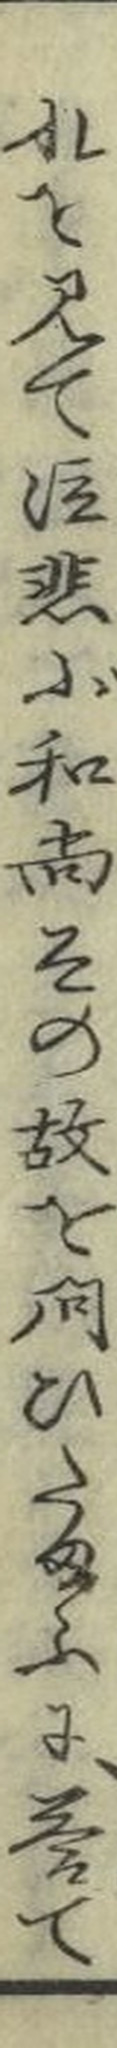れを見て泣悲ぶ、和尚その故を問ひたひたまふに、答て

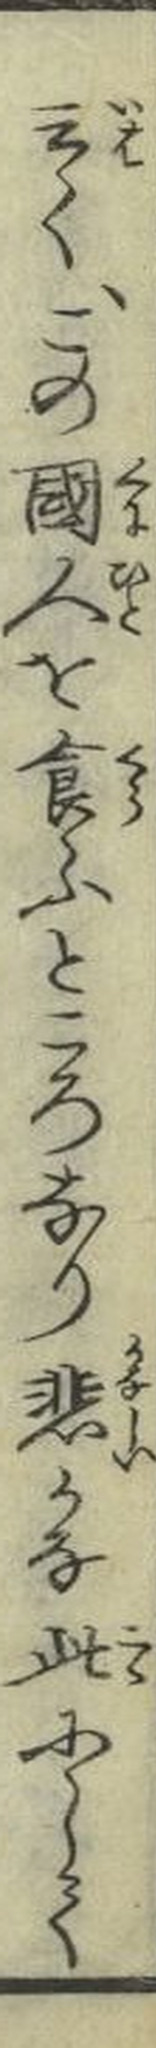云く、この国人を食ふところなり悲かな此にして
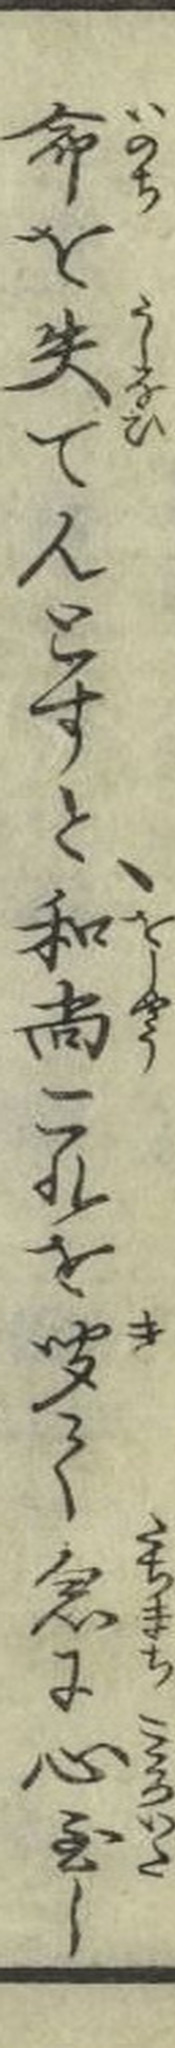命を失てんとすと、和尚これを聞て忽に心至し
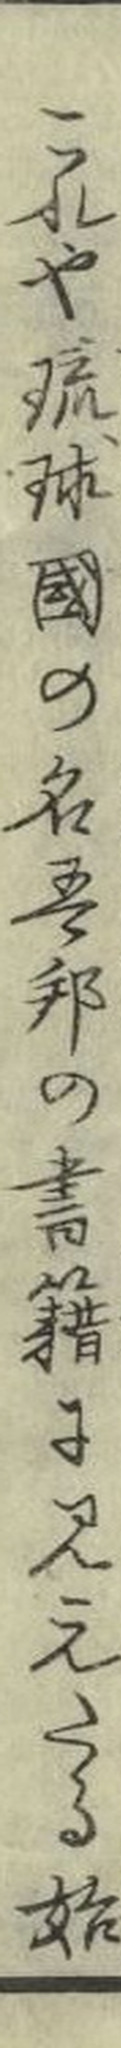これや琉球国の名、吾邦の書籍に見えたる始
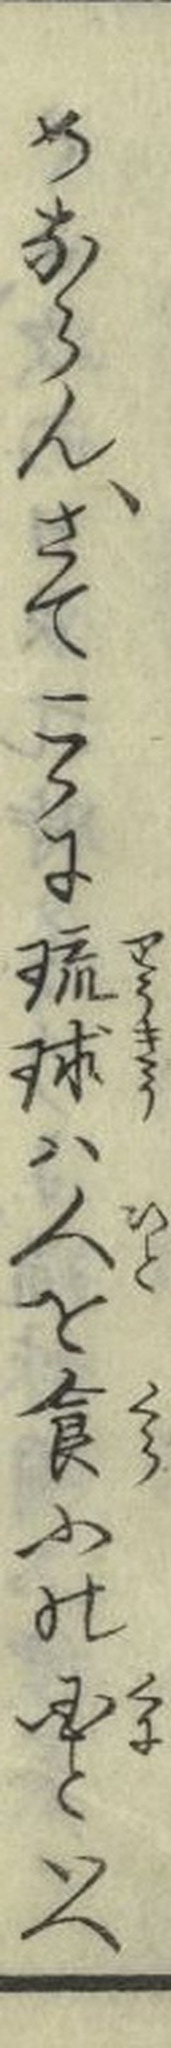めならん、さてこゝに琉球は人を食ふの国といへ
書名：琉球入貢紀略
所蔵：University of the Ryukyus Library
